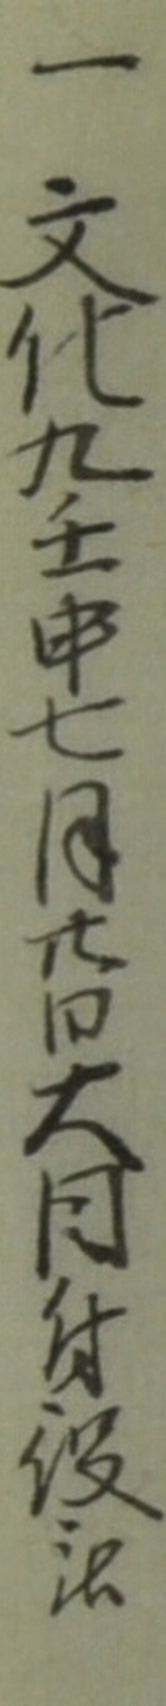一文化九壬申七月廿日大目付役被
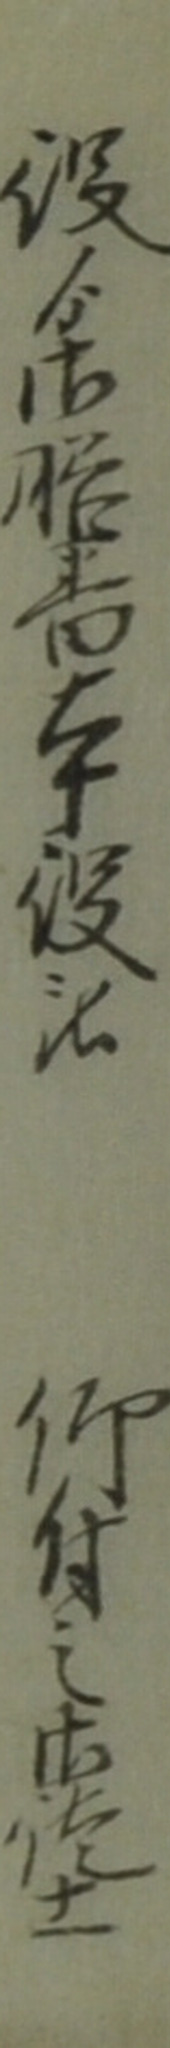役ゟ御膳番本役被仰付之御徒士

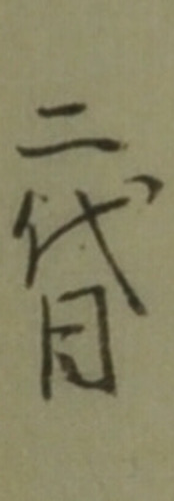二代目
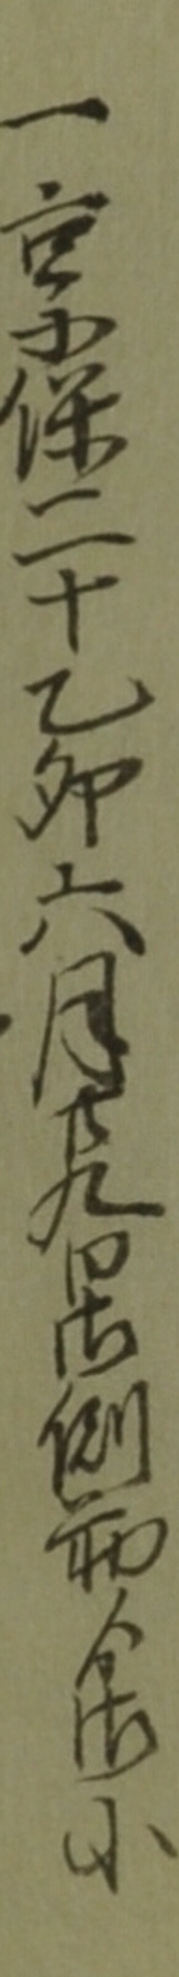一享保二十乙卯六月廿九日御側勤ゟ御小
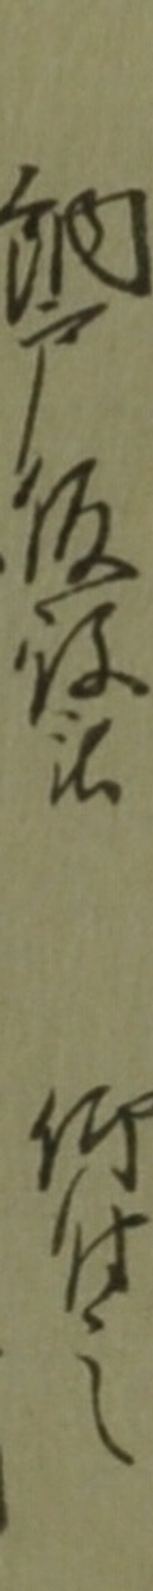納戸仮役被仰付之
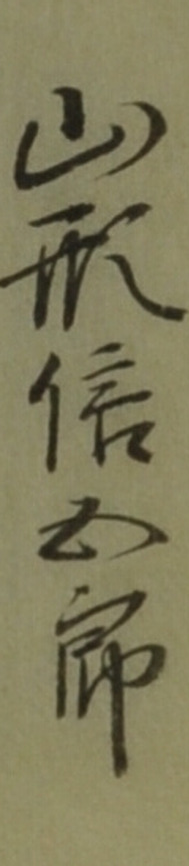山形信五郎
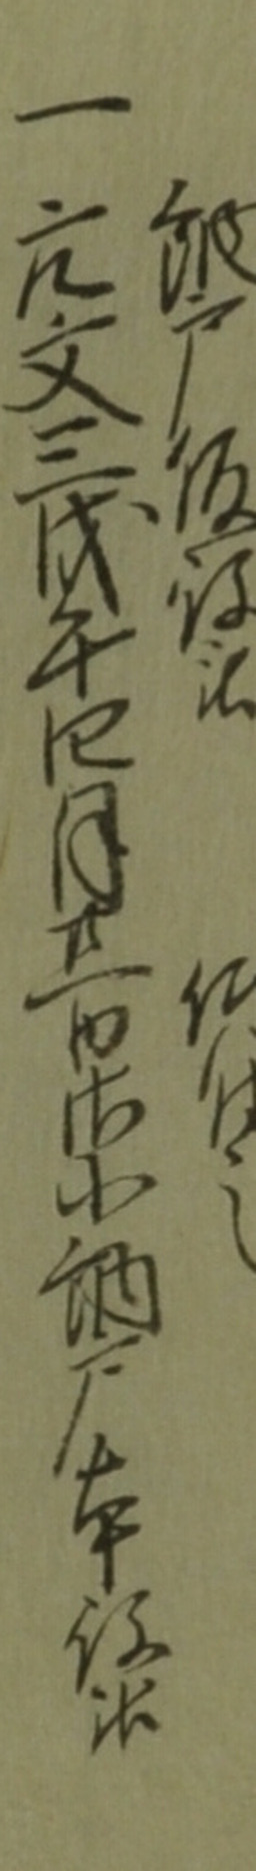一元文三戌午四月廿一日御小納戸本役被
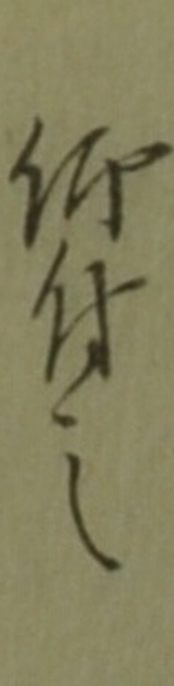仰付之
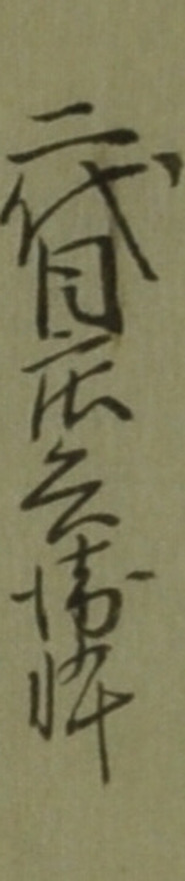二代目庄兵衛忰
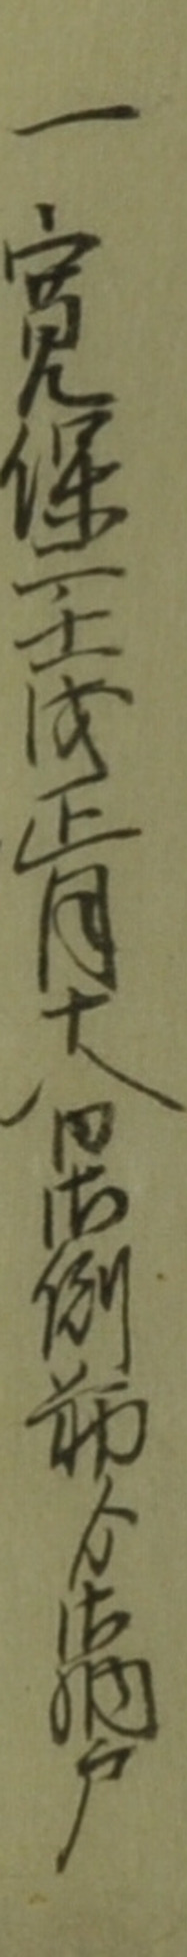一寛保二壬戌正月十八日御側ゟ御納戸
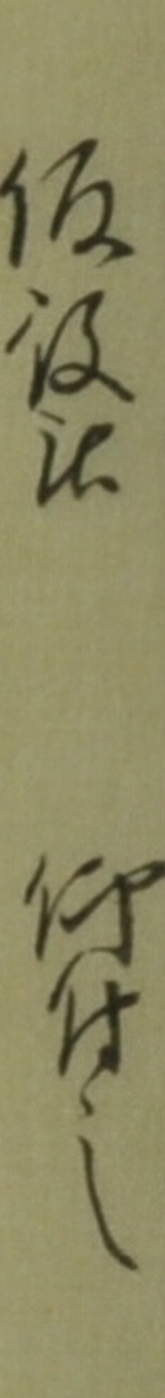仮役被仰付之
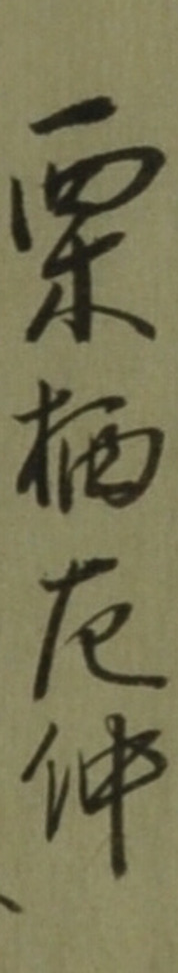栗栖左仲

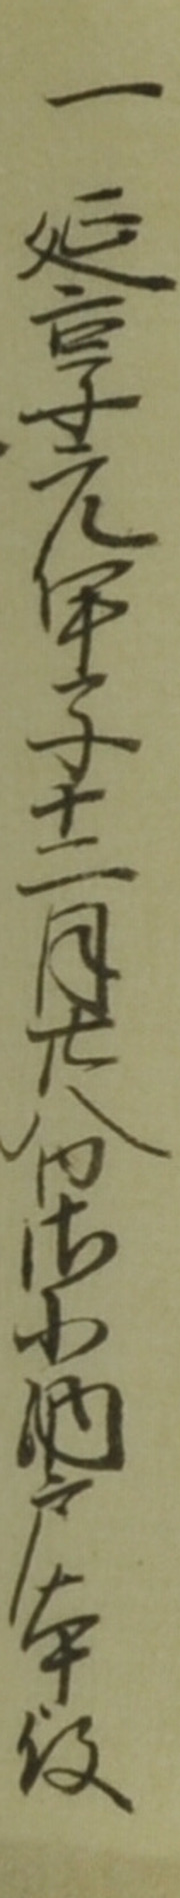一延享元甲子十二月廿八日御小納戸本役
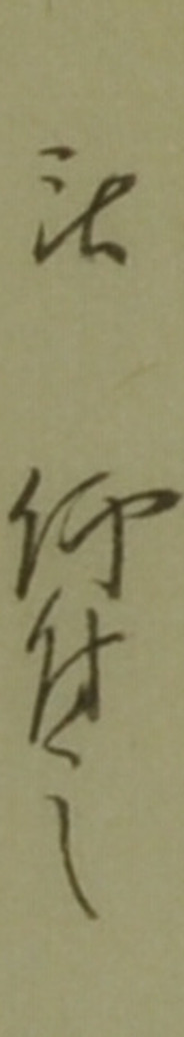被仰付之
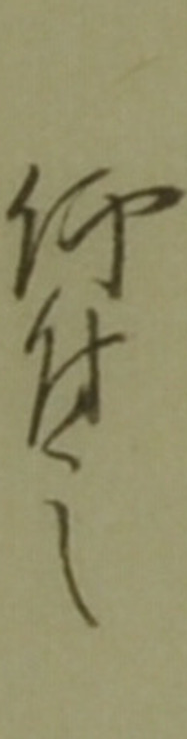仰付之
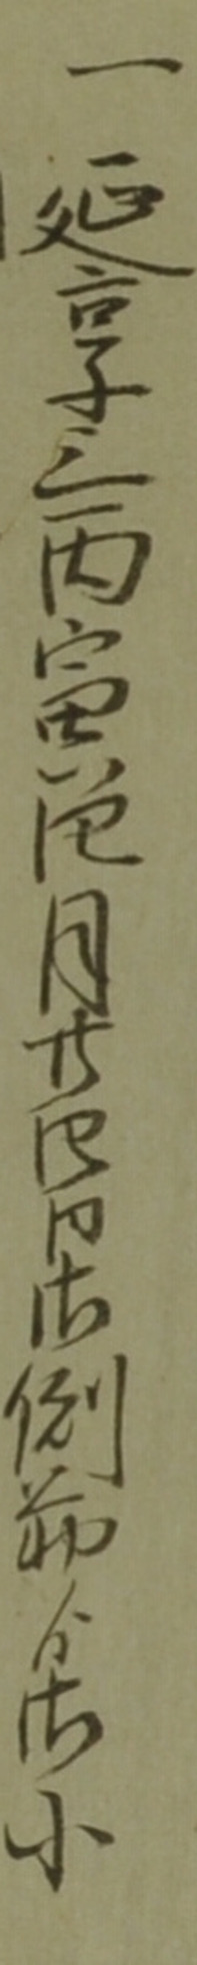一延三丙寅四月廿四日御側勤ゟ御小
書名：諸御役代々録（四）
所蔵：伊那市立高遠町図書館・合同会社AMANE
